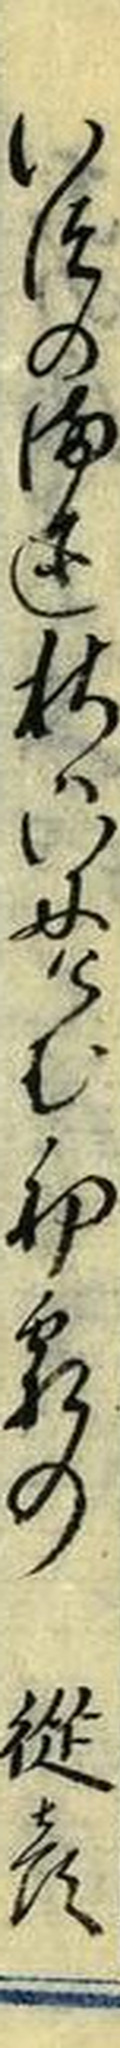いつのまに秋はいにけむ初霜の從彦
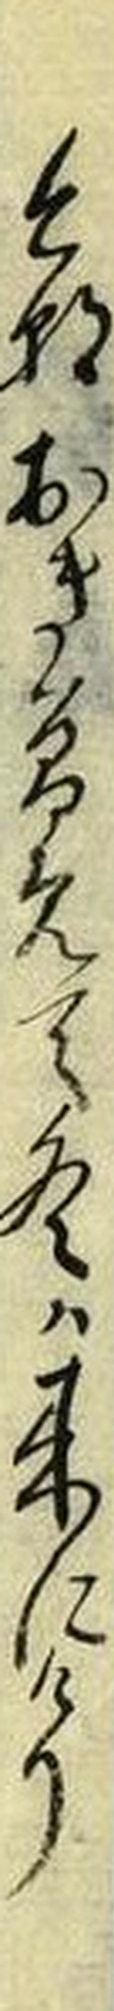今朝おきそめて冬は来にけり
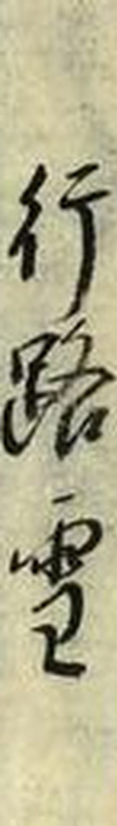行路雪
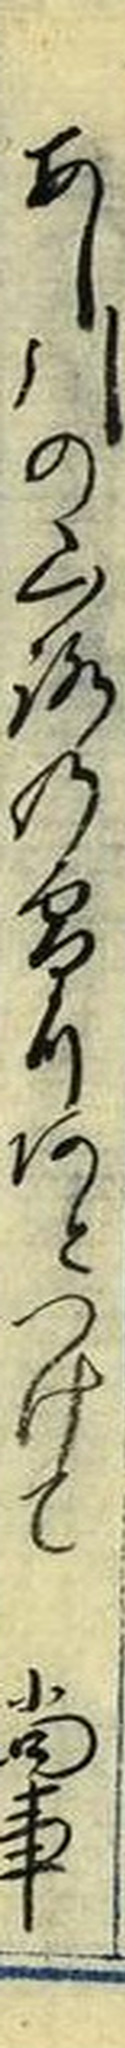あし引の山路の雪にあとつけて尚事
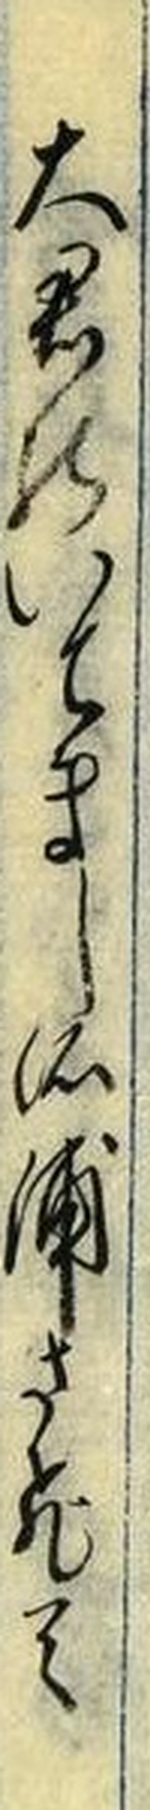大君のいてまし所浦さひて友嶌
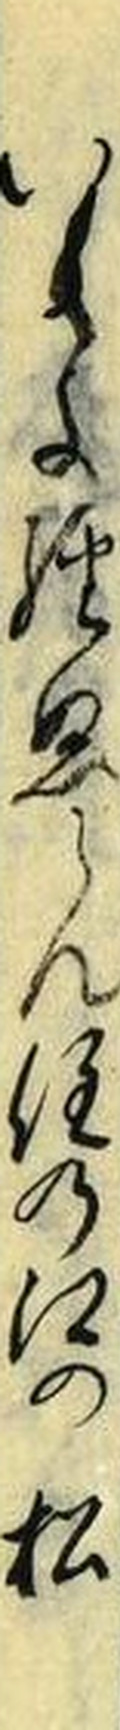いくよ経ぬらん住の江の松

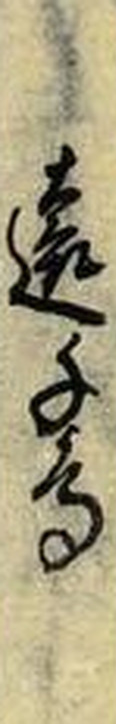遠千鳥
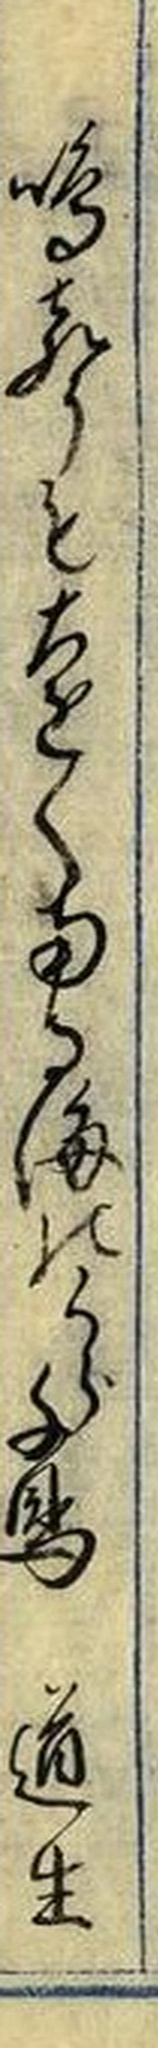鳴聲も遠くなる海のうら千鳥道生
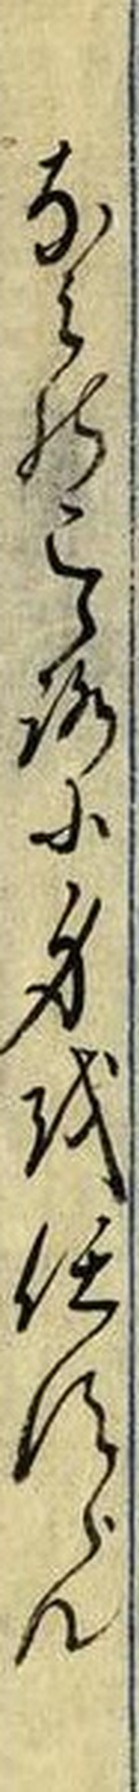波のこゝろに身を任すらん
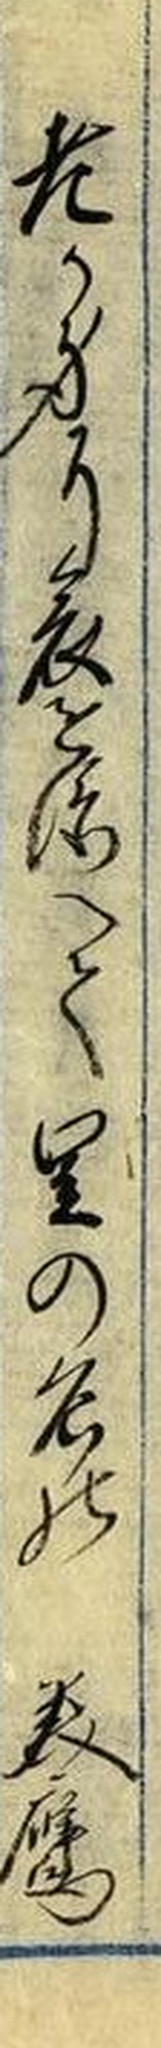老か身に衾を添へて星の名の美鷹
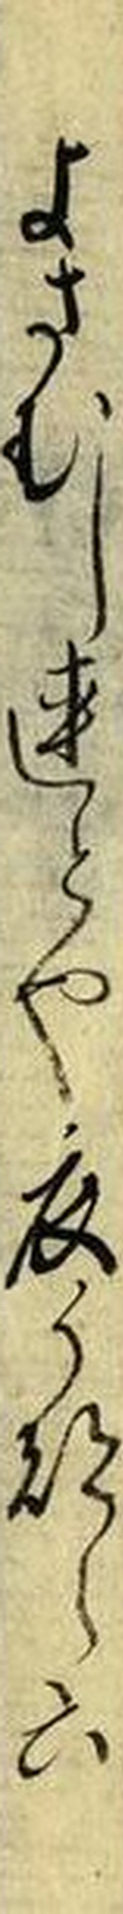よさむしれとや衣うつしむ
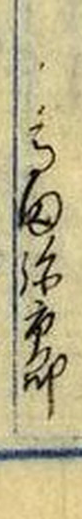高田弥市郎
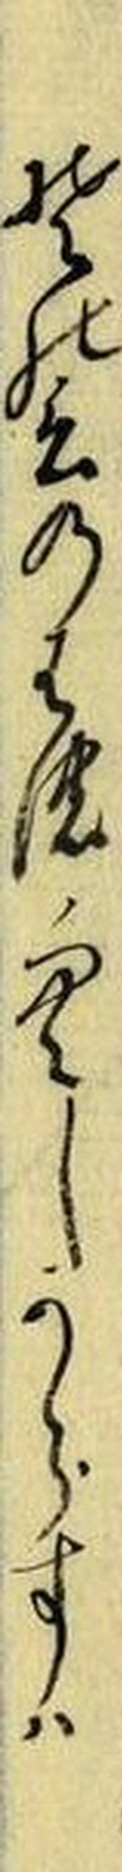その言のはの空しからすは
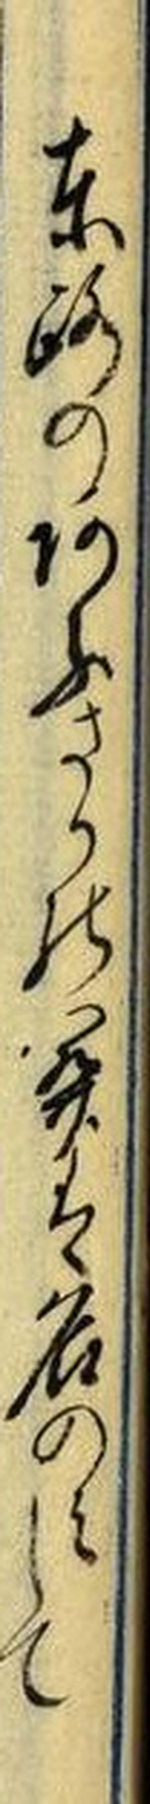東路のあふさかの関は君のみして正裕
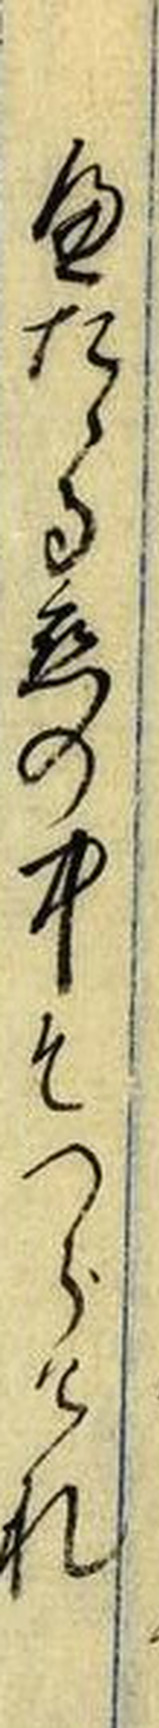へたゝる恋の中そつらけれ
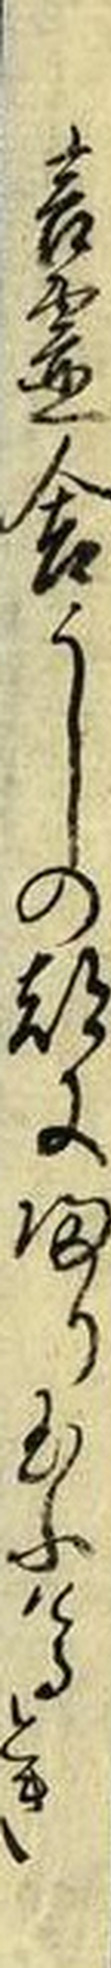言霊舎うしの都に帰り玉ふけるとき
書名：温古集 三巻
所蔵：福井県文書館 Fukui Prefectural Archives
